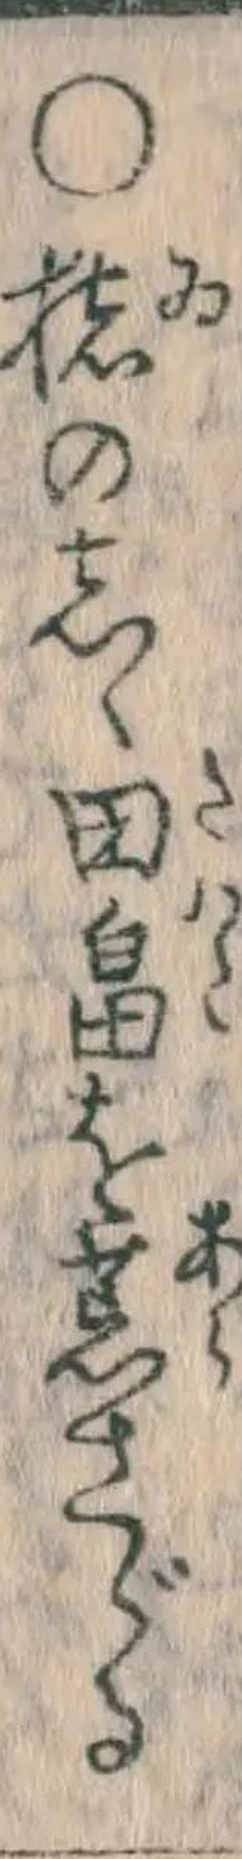○猪のしゝ田畠を荒さゞる
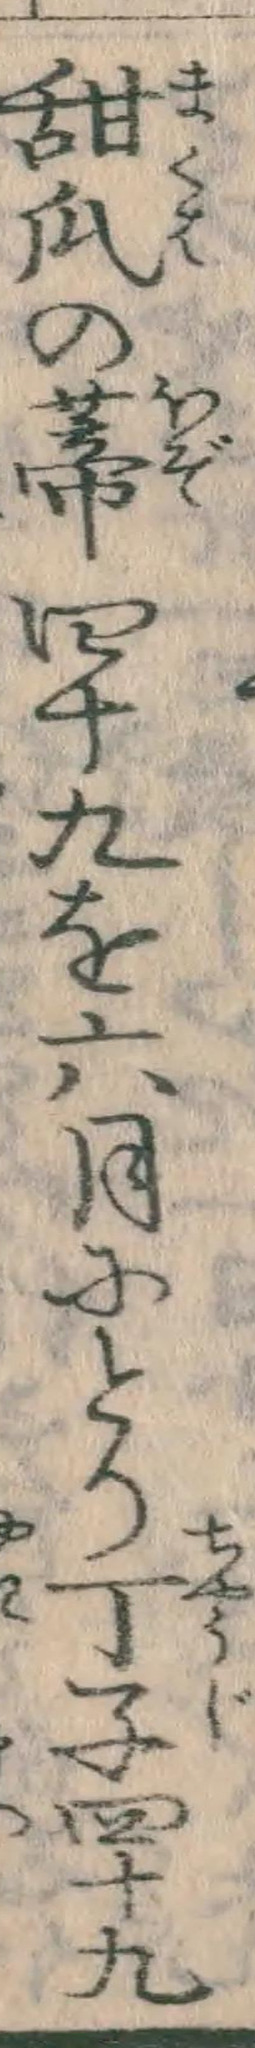甜瓜の蔕四十九を六月にとり丁子四十九
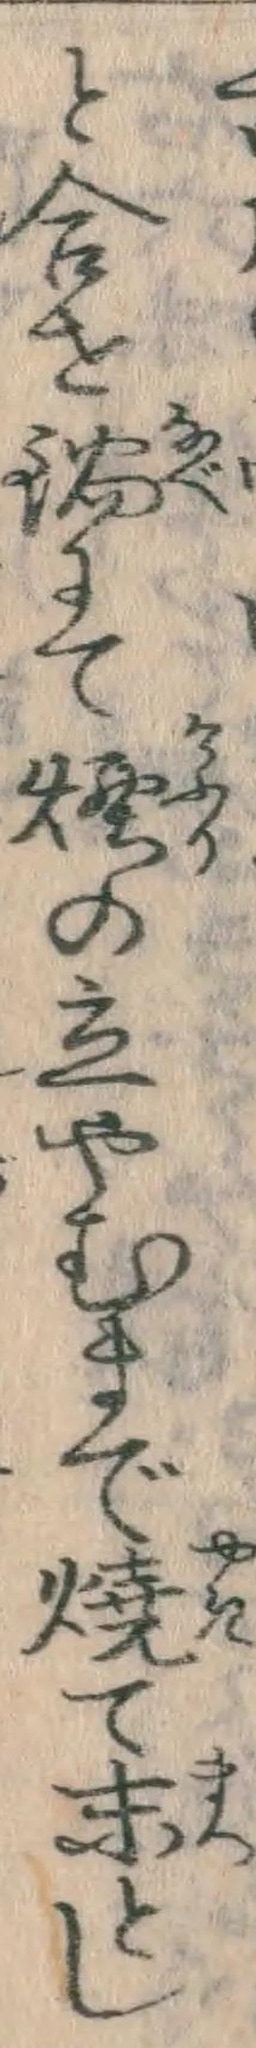と合せ鍋にて煙の立やむまで焼て末とし
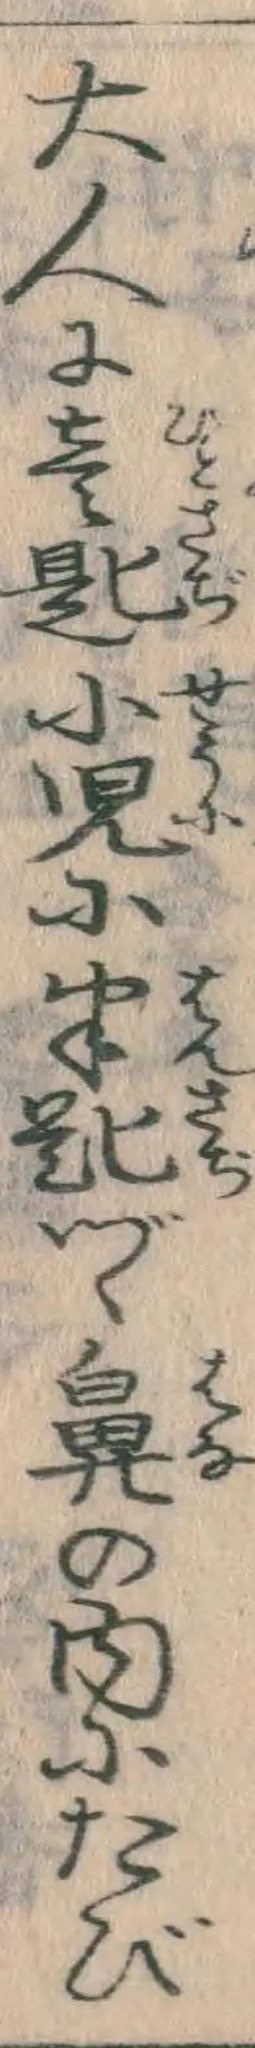大人に壱匙小児に半匙づゝ鼻の内にたび
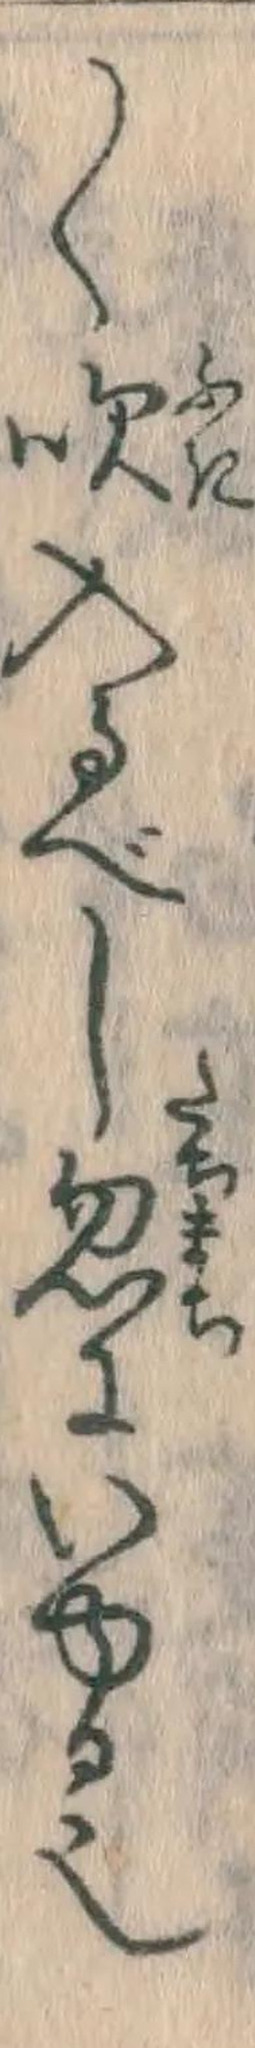〳〵吹入るべし忽にいゆる也
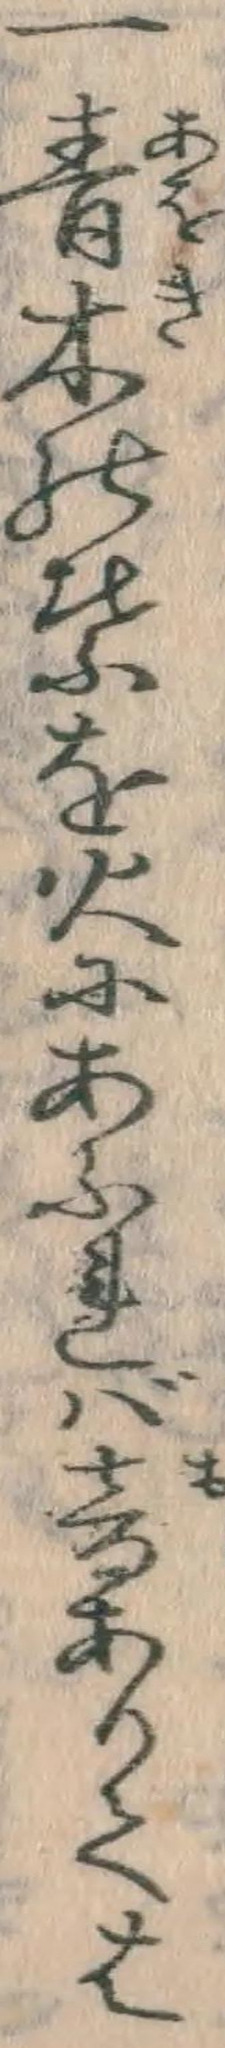一青木の葉を火にあふれば音ありては
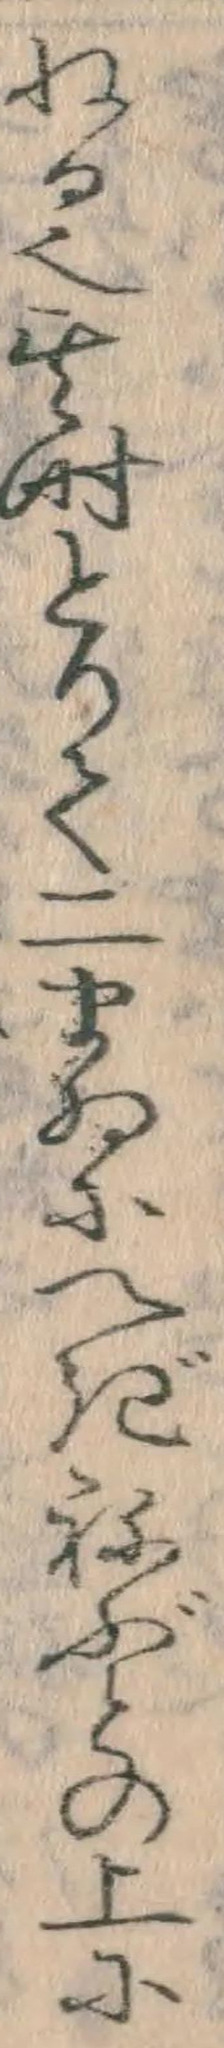ねる也其時とりて二まゐにへぎねぶとの上に
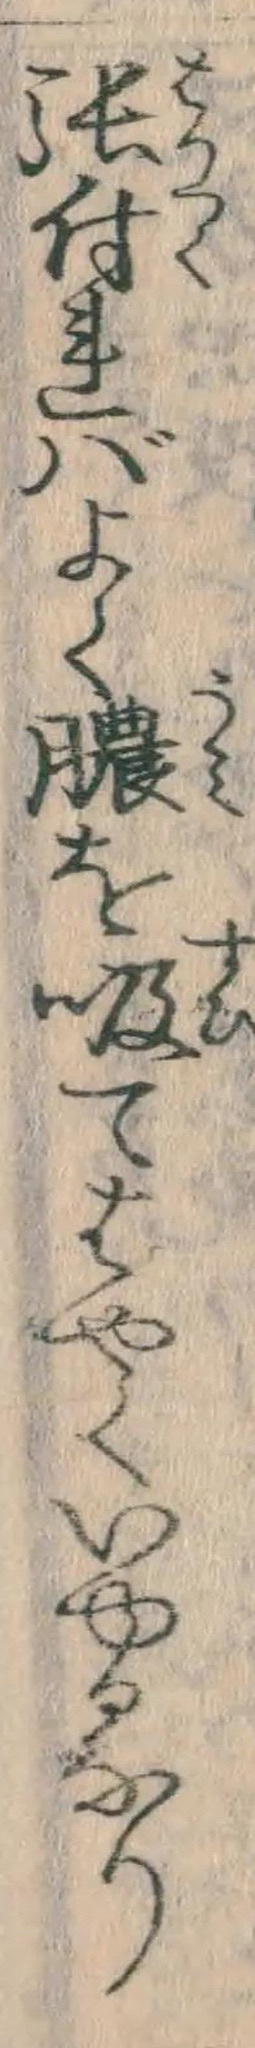張付ればよく膿を吸てはやくいゆるなり
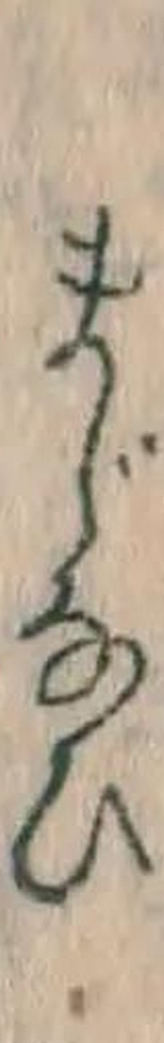まじなひ
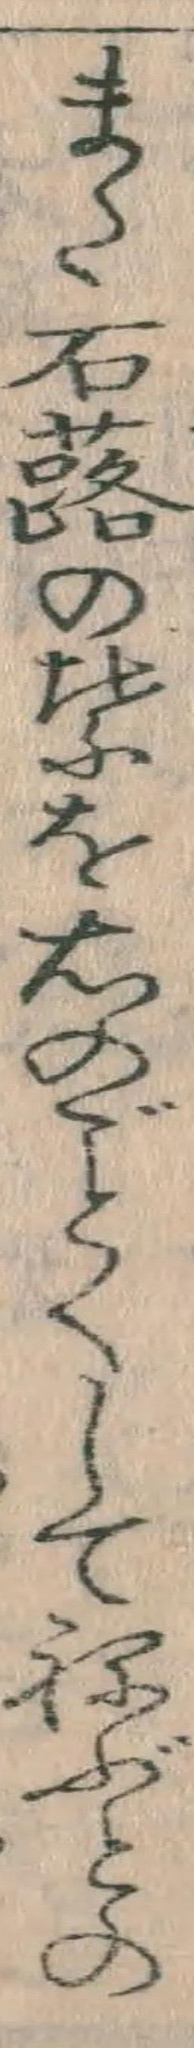また石蕗の葉を右のごとくしてねぶとの
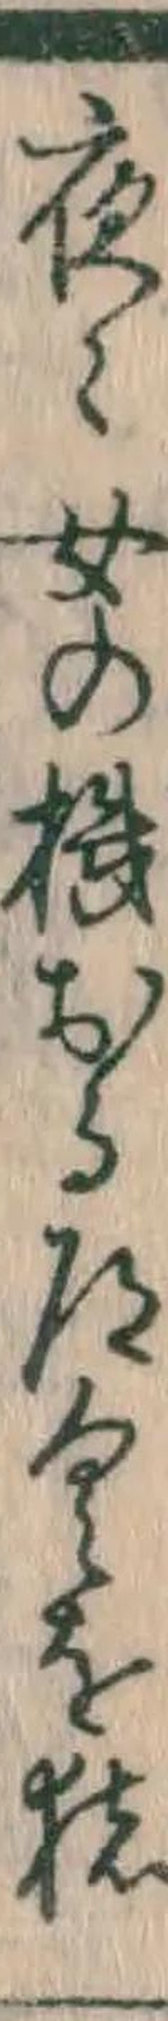夜々女の機おる道具を猪
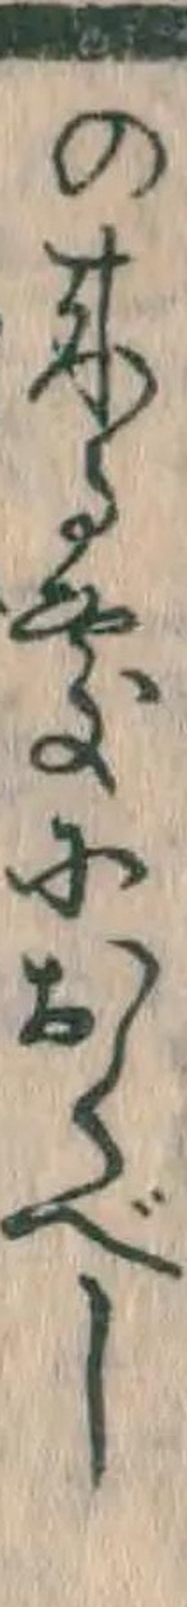の来る処におくべし
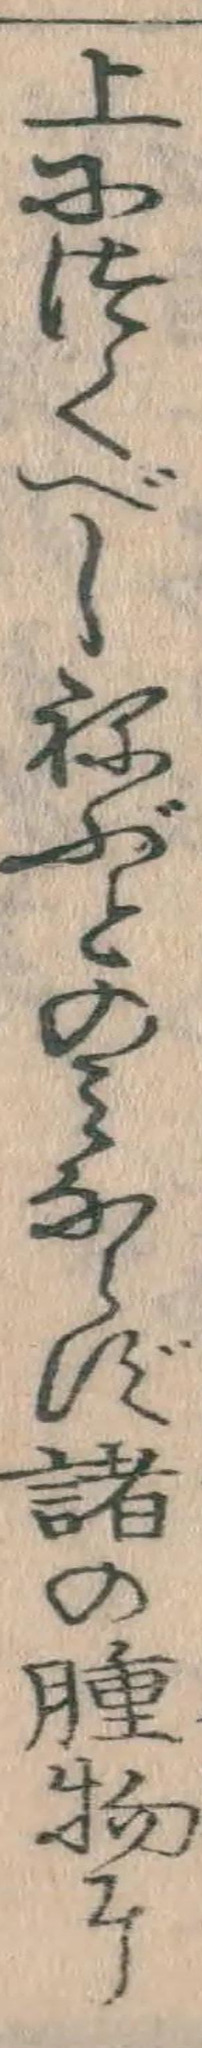上につくべしねぶとのみならず諸の腫物に
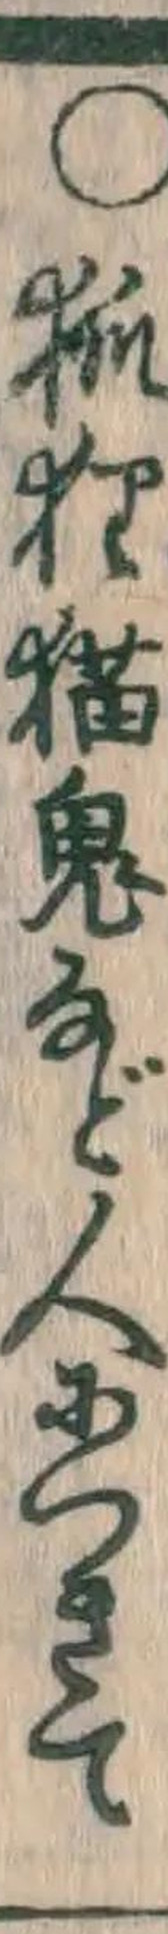○狐狸猫鬼など人につきて
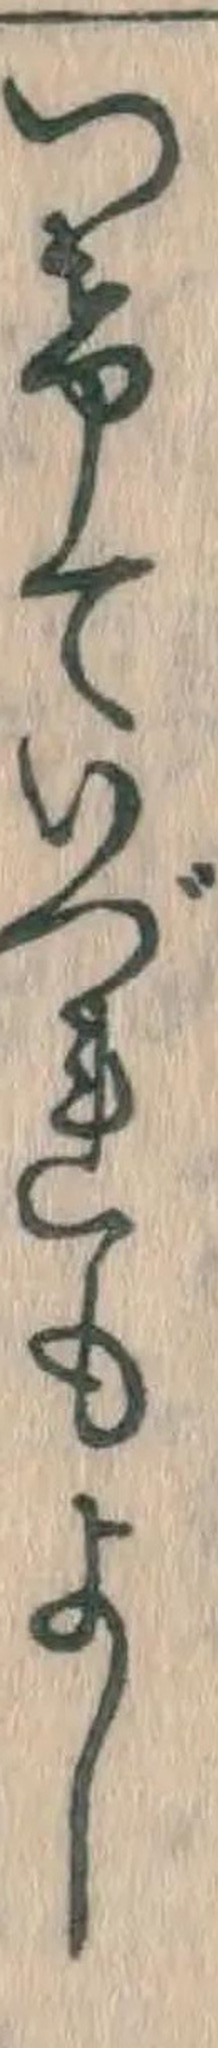つけていづれもよし
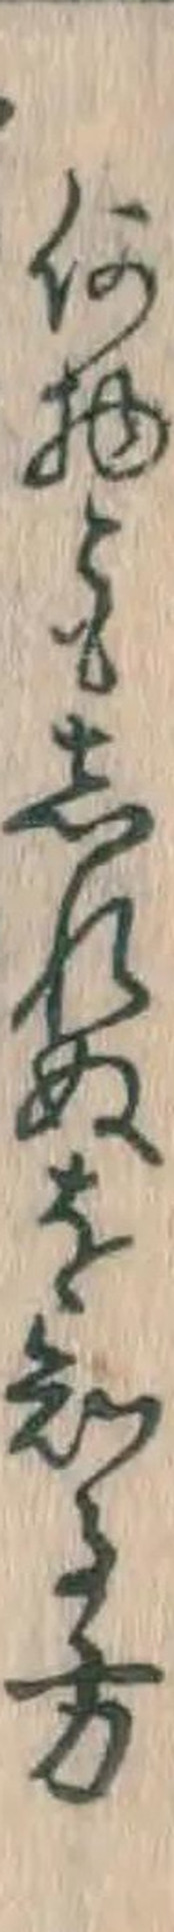何物ともしれぬを知る方
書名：広益秘事大全 3巻. [4]
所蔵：国立国会図書館 National Diet Library, JAPAN
